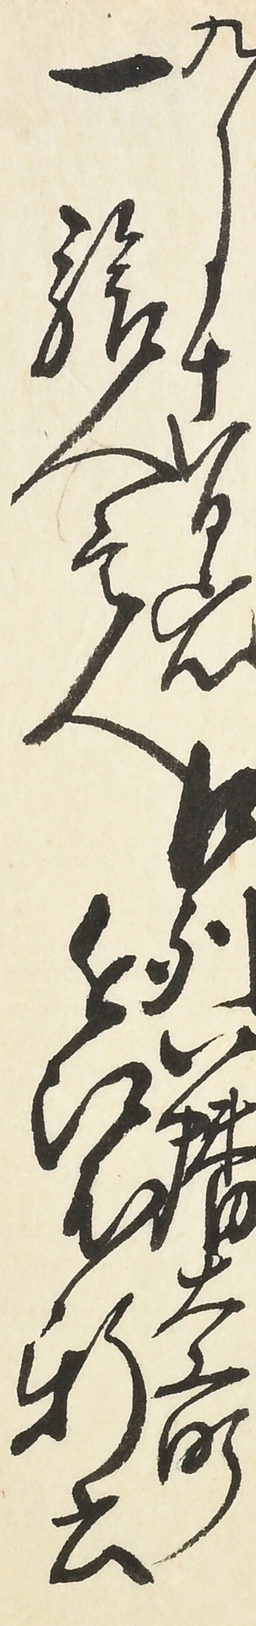一旅人壱人近江屋新六

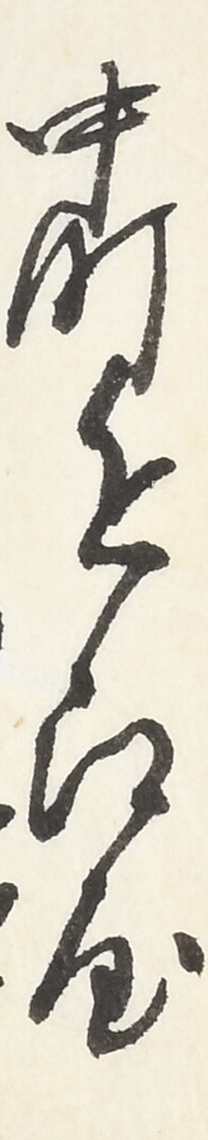中町近江屋
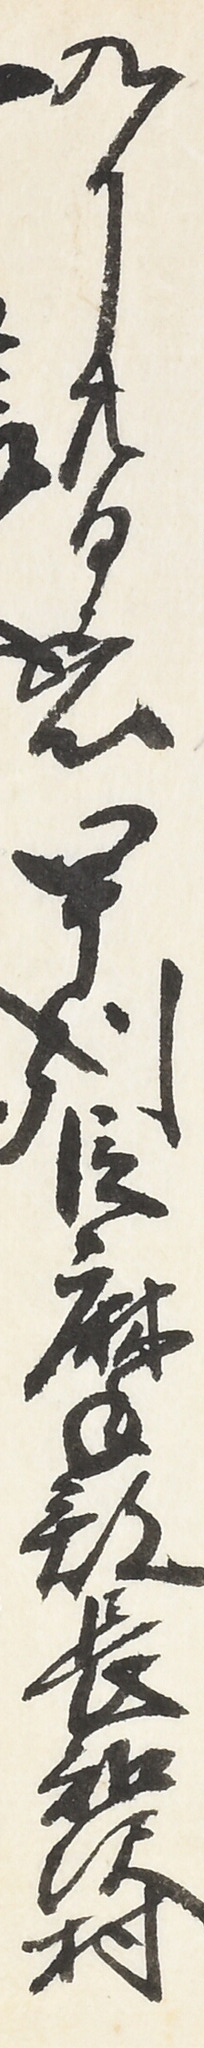九月廿日着甲州巨摩郡長知沢村
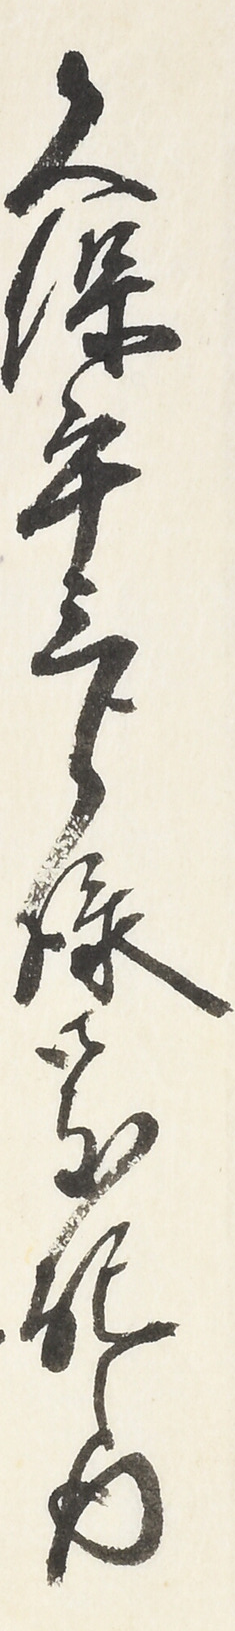久保平三郎様御支配之内
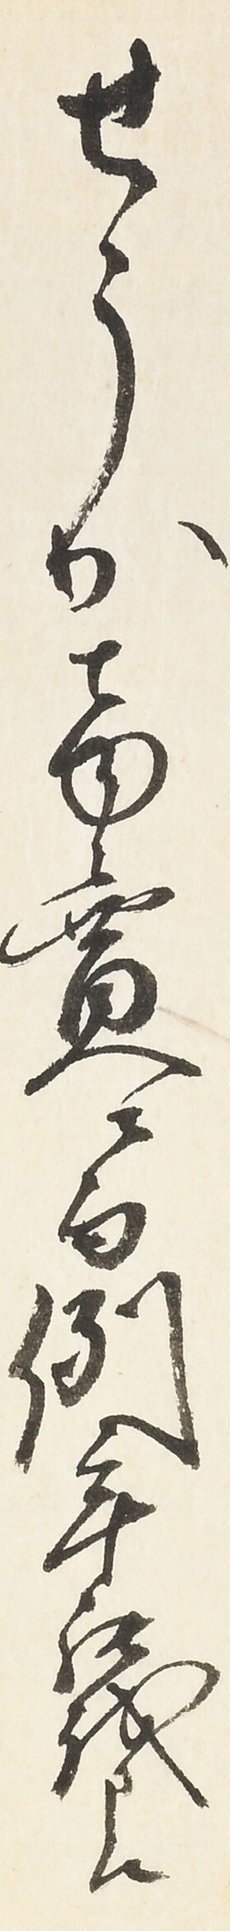せうか商売ニ而例年罷越申候
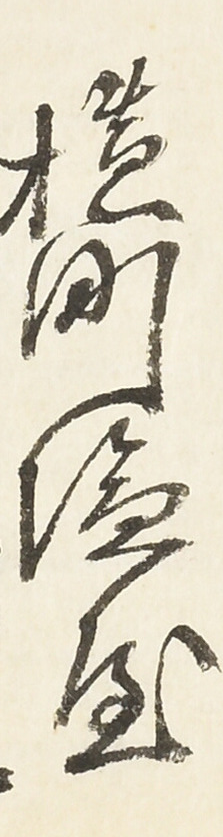横町塩屋
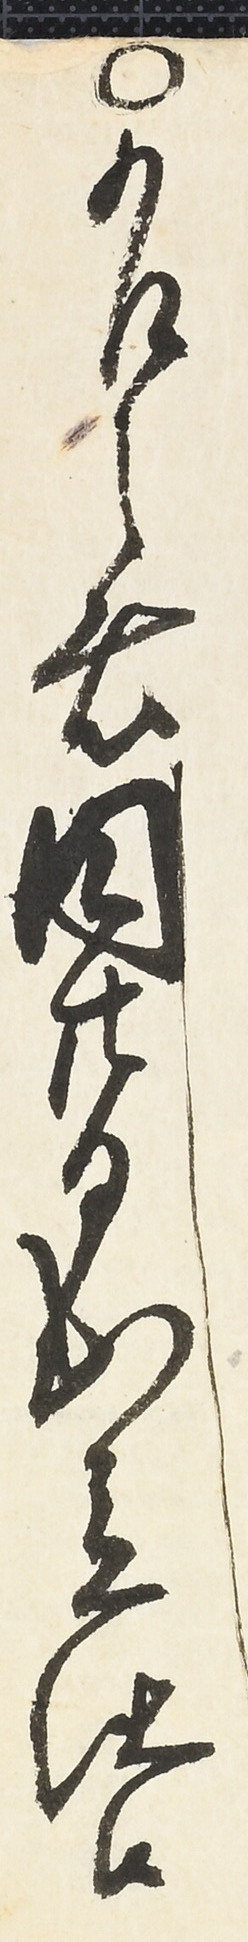〇右之者同廿日出立仕候
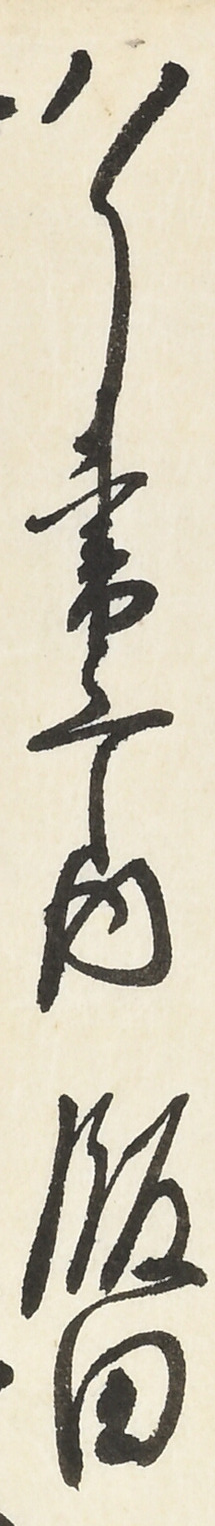八月書上之内飯田
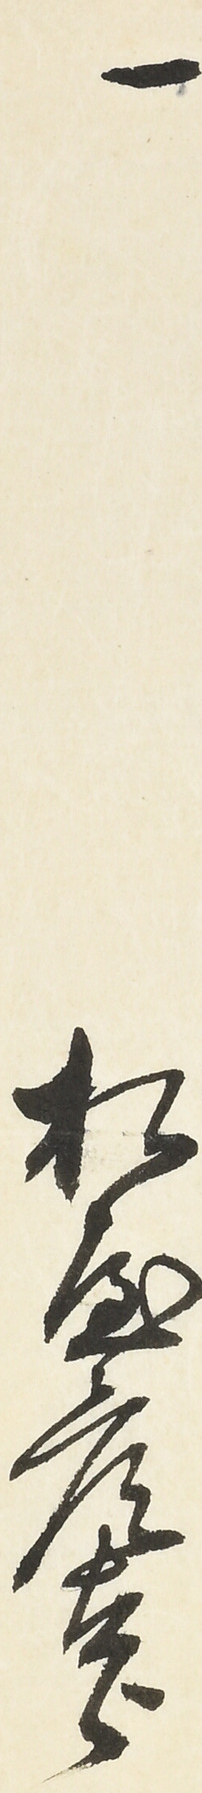一松屋彦太郎
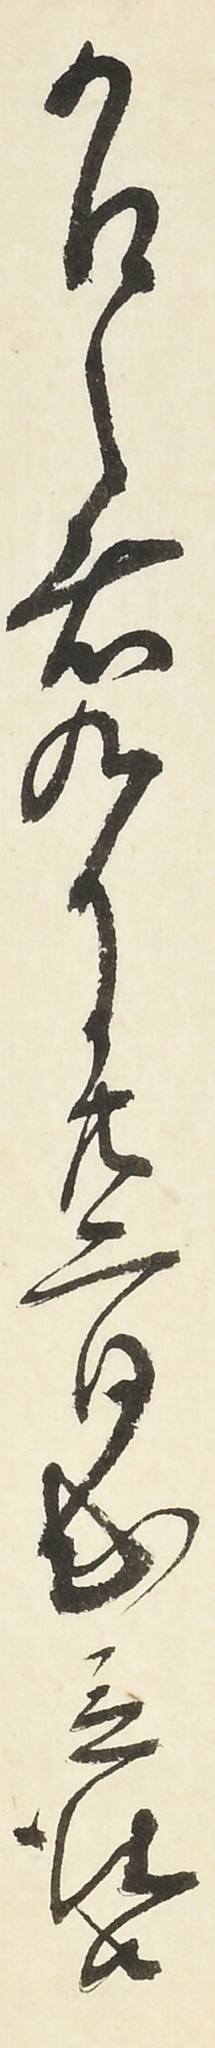右之者同九月廿二日出立仕候
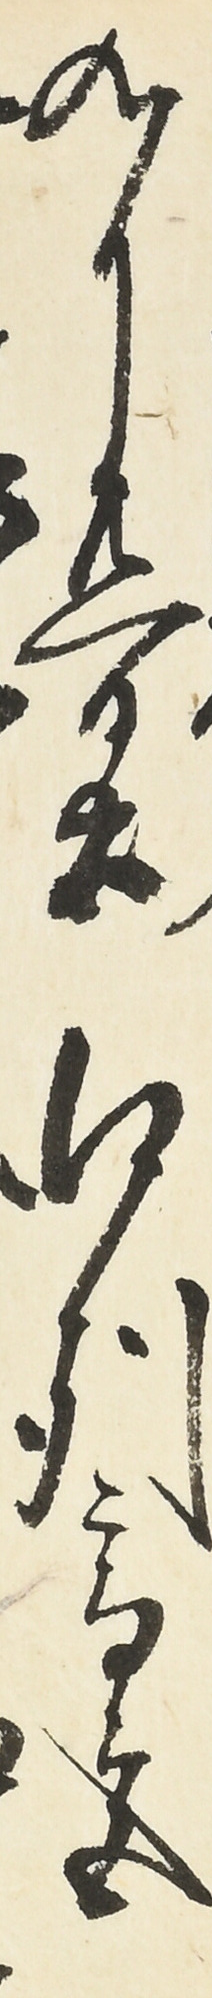九月廿二日着江州高宮
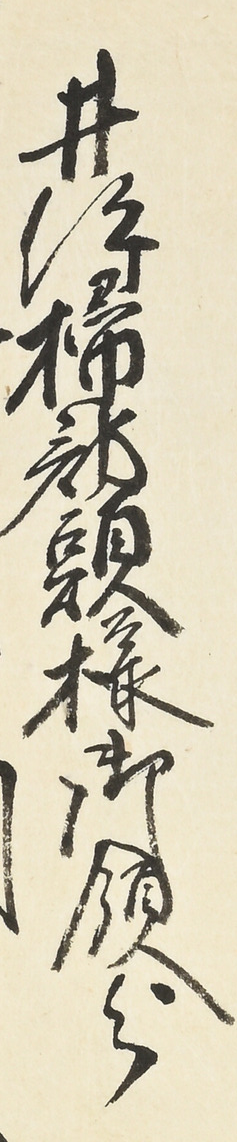井伊掃部頭様御領分
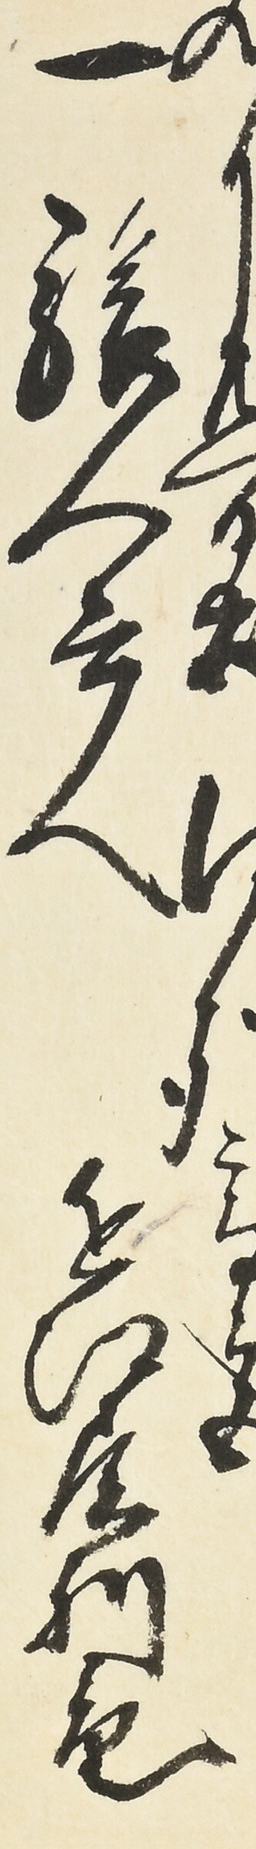一旅人壱人近江屋利兵衛
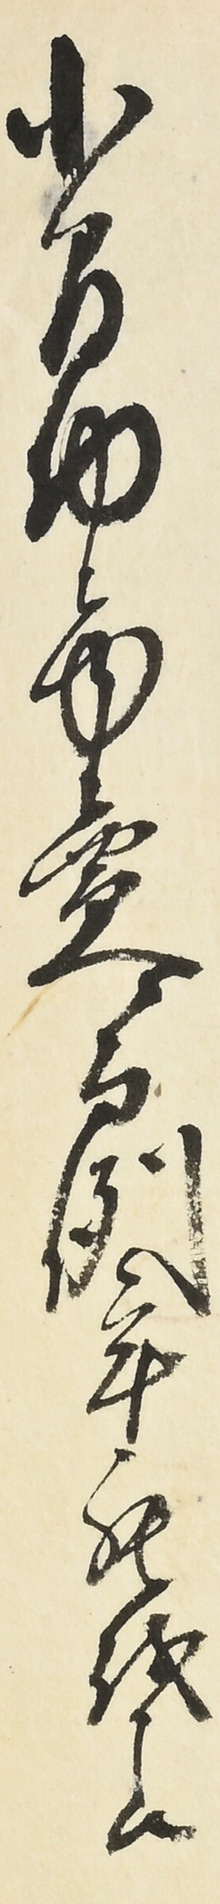小間物商売ニ而例年罷越申候
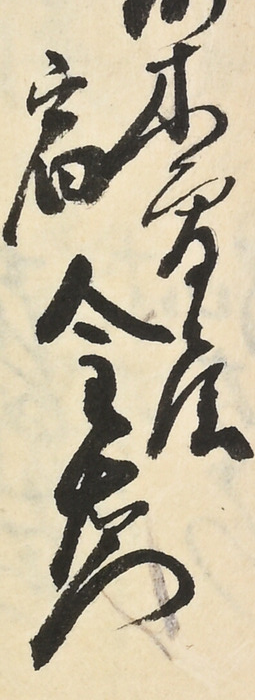宿善左衛門
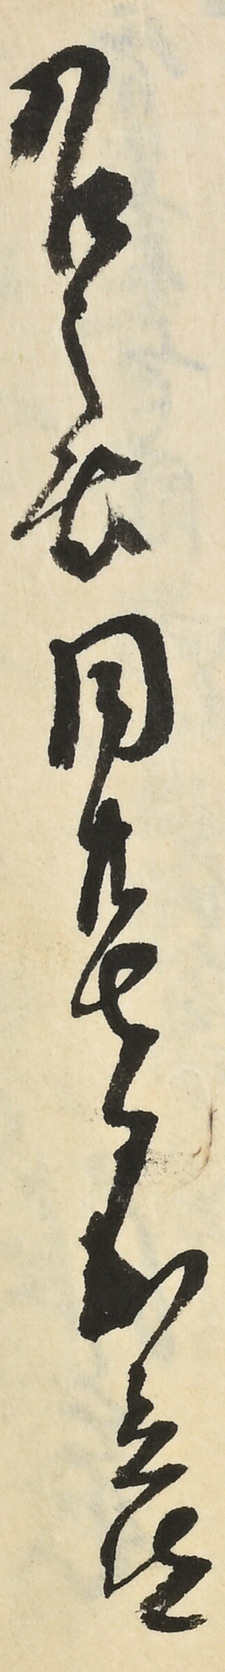〇右之者同廿日出立仕候
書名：町中旅人泊控帳
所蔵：伊那市立高遠町図書館・合同会社AMANE
